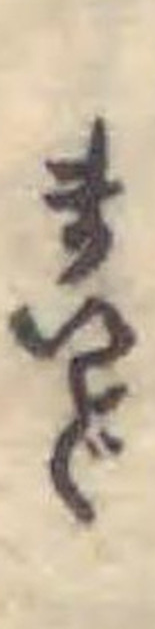まいど
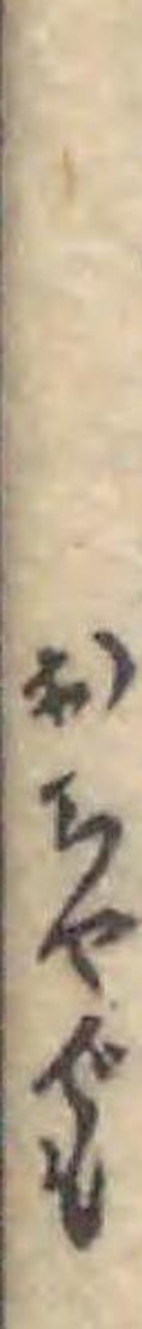おちやでも
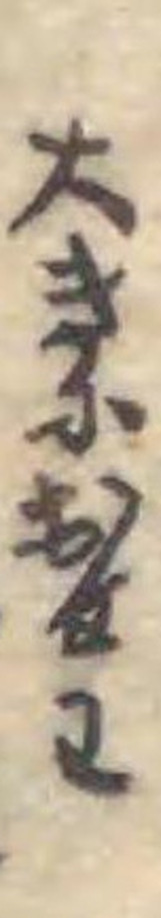大きにおせわ
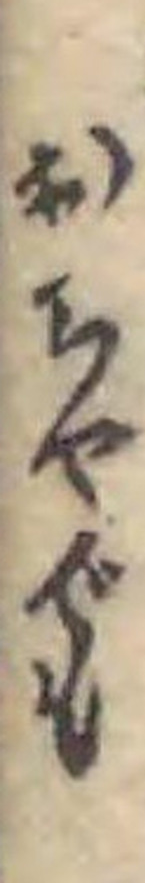おちやでも
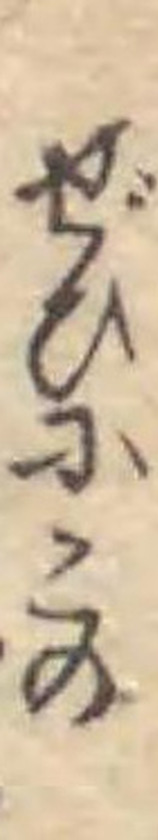ぜひにこの
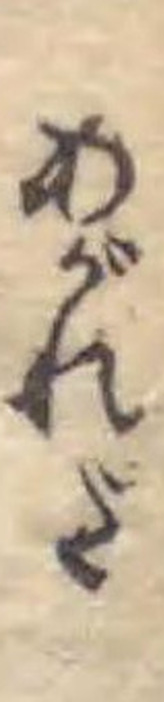あがれだ
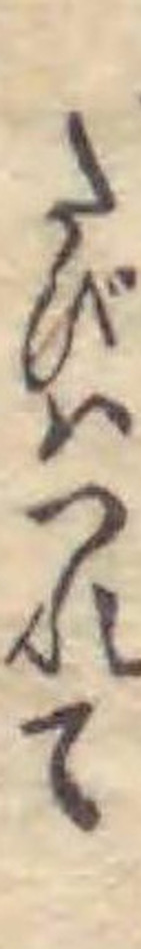たびはつれて
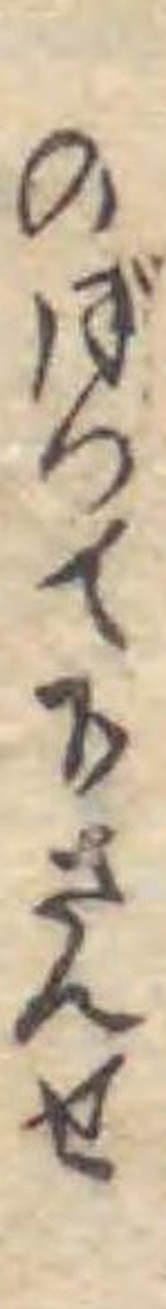のぼつて下さんせ
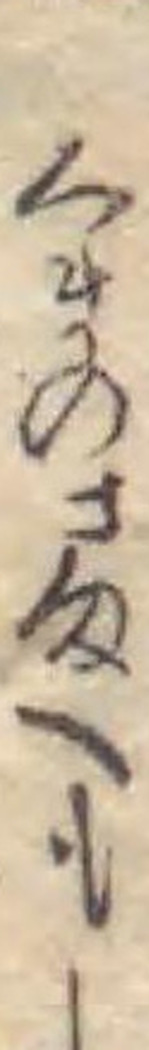くまのさまへも
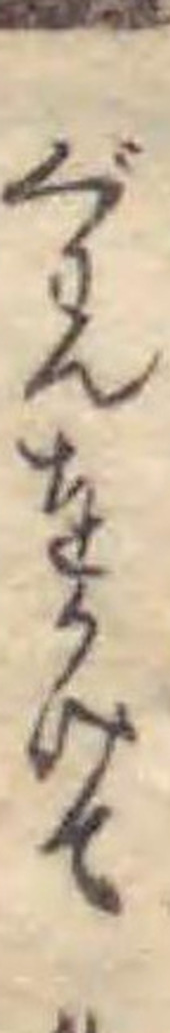ぐわんをかけて
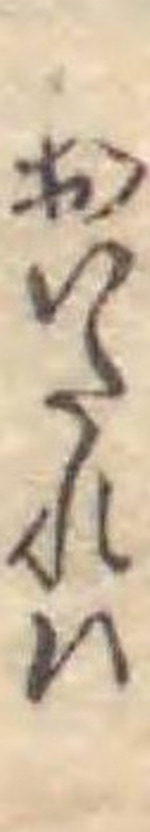おいたれは
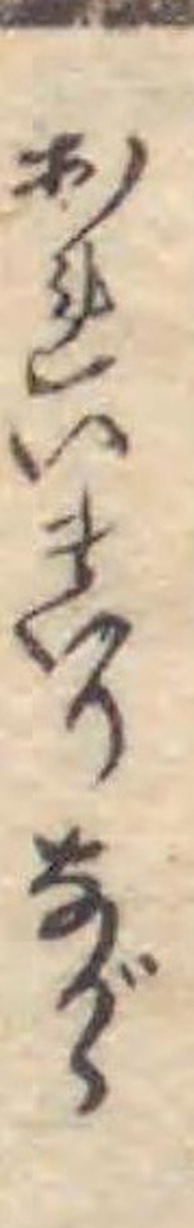おれいまいりながら
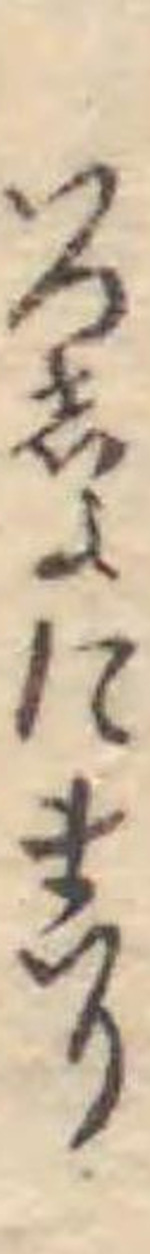いつしよにまいり
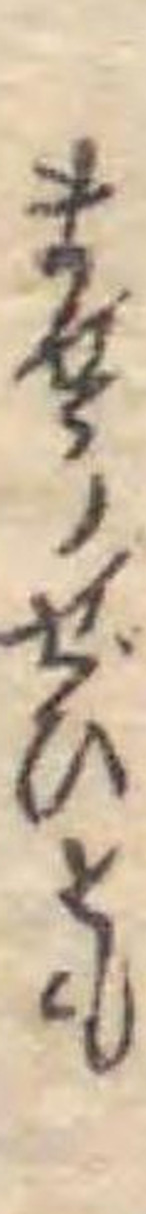ませうぜひとも
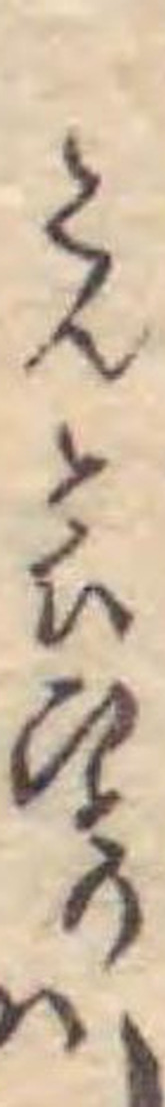こんとはひとり
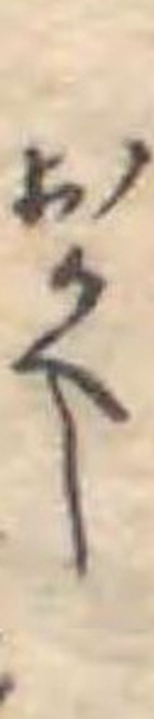おかへし
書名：鐘入七人化粧 : 3巻
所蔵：国立国会図書館 National Diet Library, JAPAN
